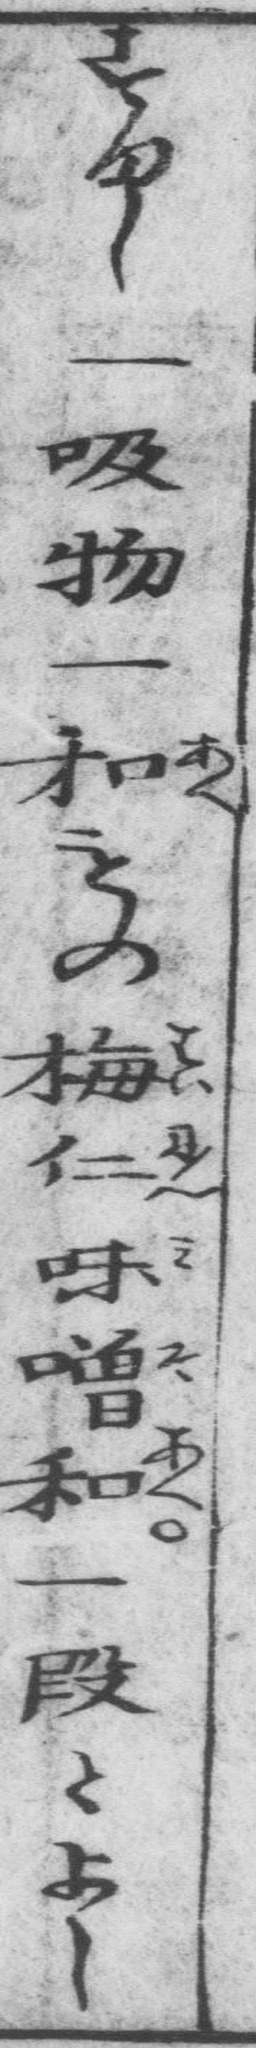すまし一吸物一和もの梅仁味噌和。一段とよし

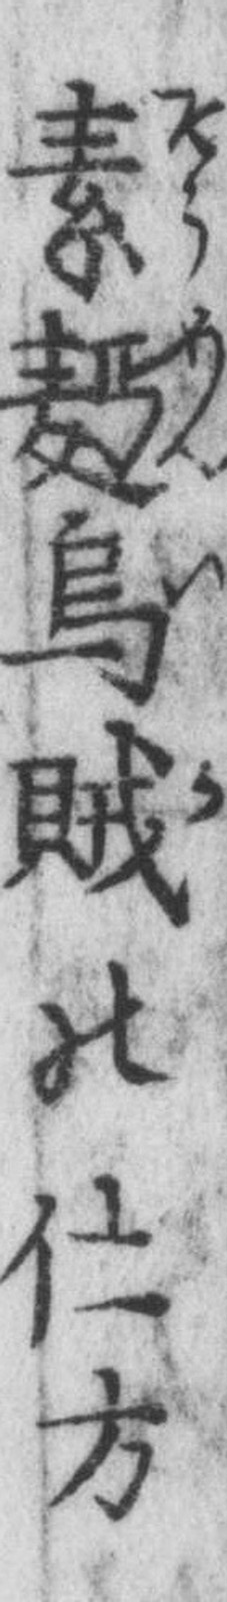素麺烏賊の仕方
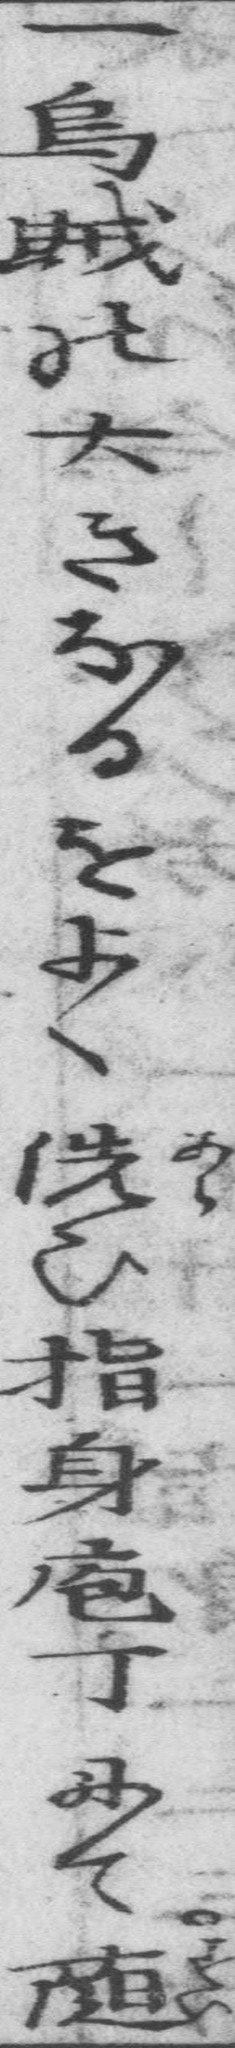一烏賊の大きなるをよく洗ひ指身包丁にて。随
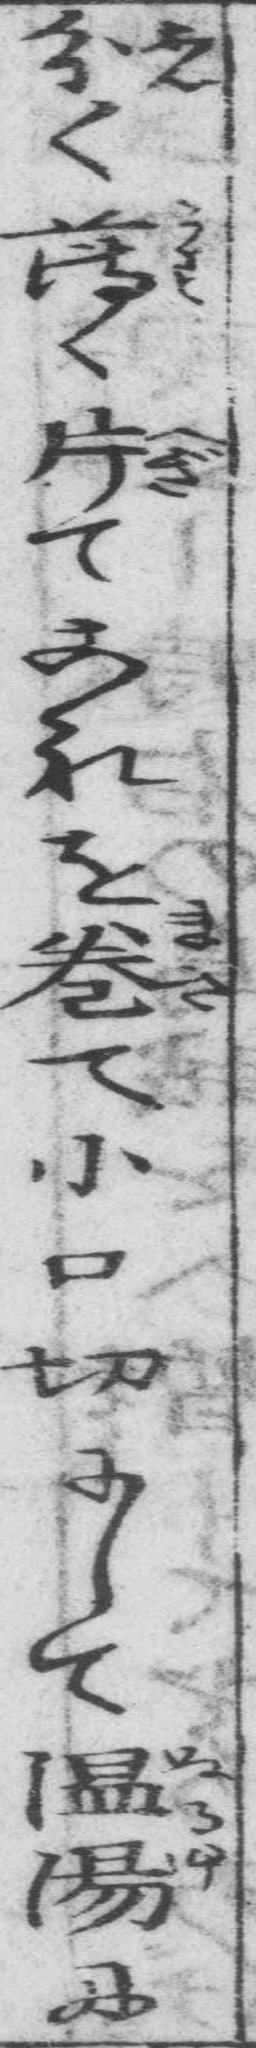分〳〵薄く片てこれを巻て小口切にして温湯に
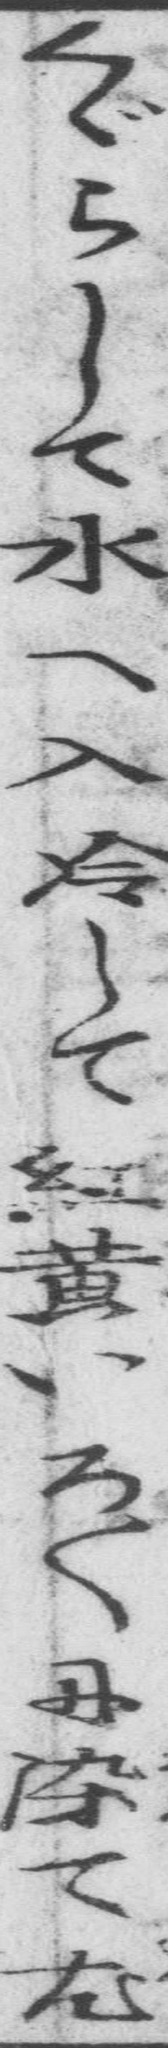くゞらして。水へ入冷して紅黄いろ〳〵に染て尤
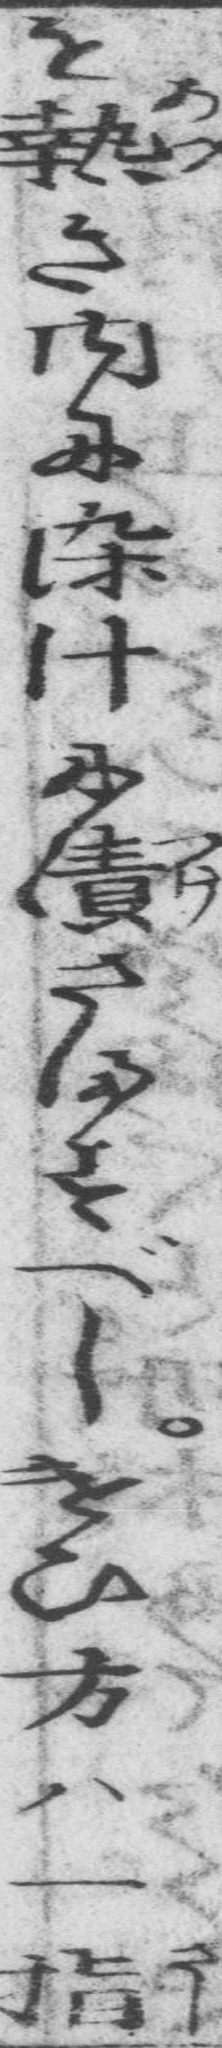も熱き内に染汁に漬さますべし。遣ひ方は一指
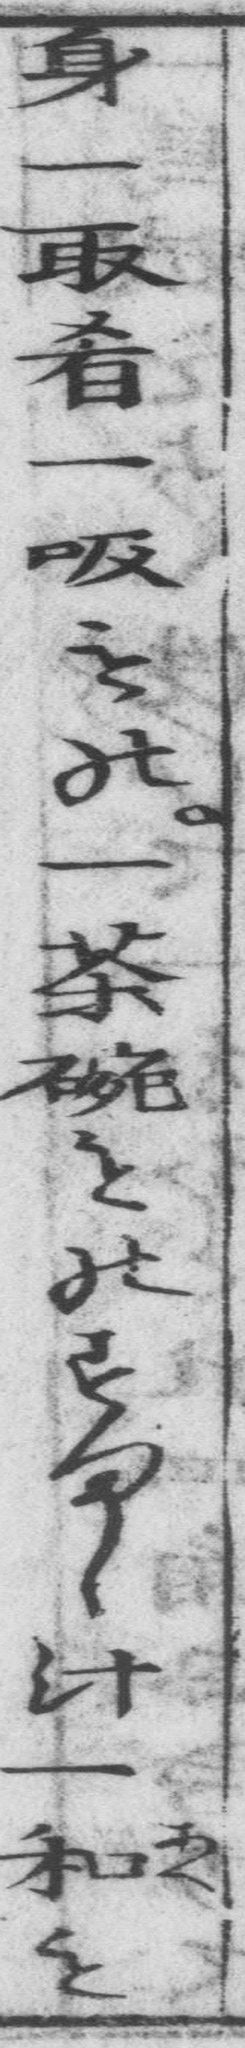身一取肴一吸もの。一茶椀ものすまし汁一和も
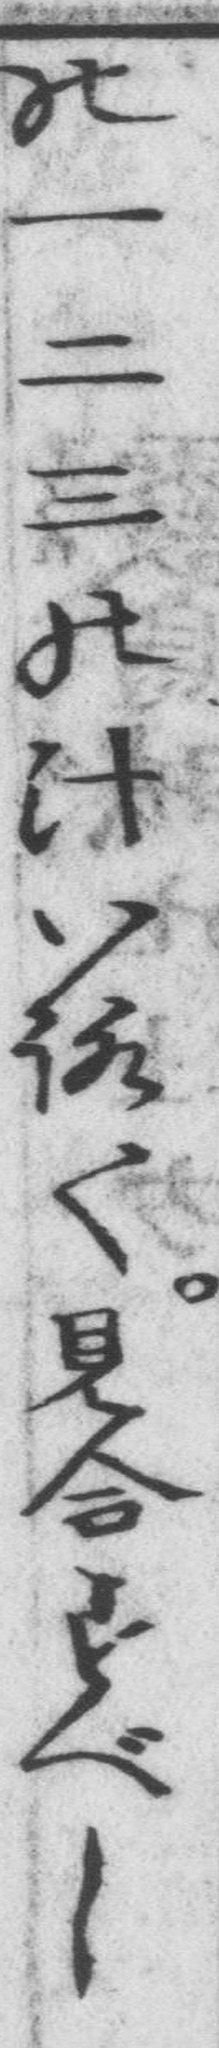の一二三の汁いろ〳〵。見合すべし
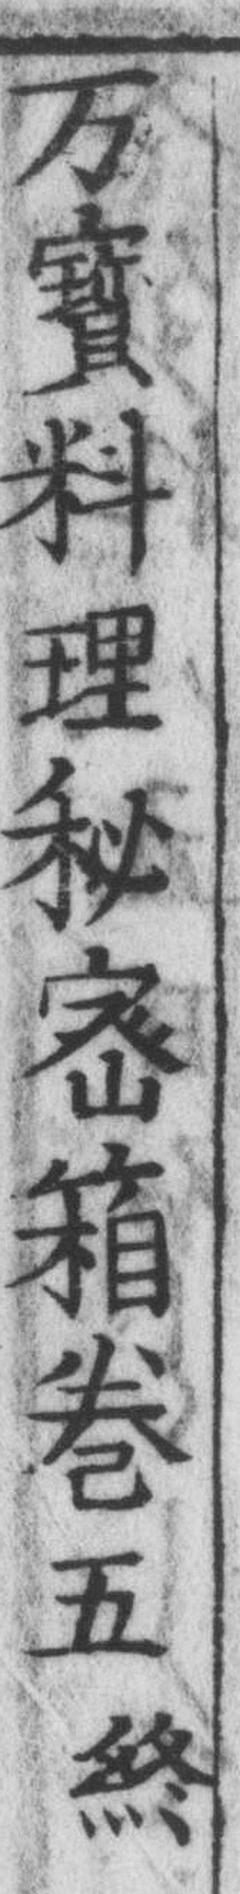万宝料理秘密箱巻五終

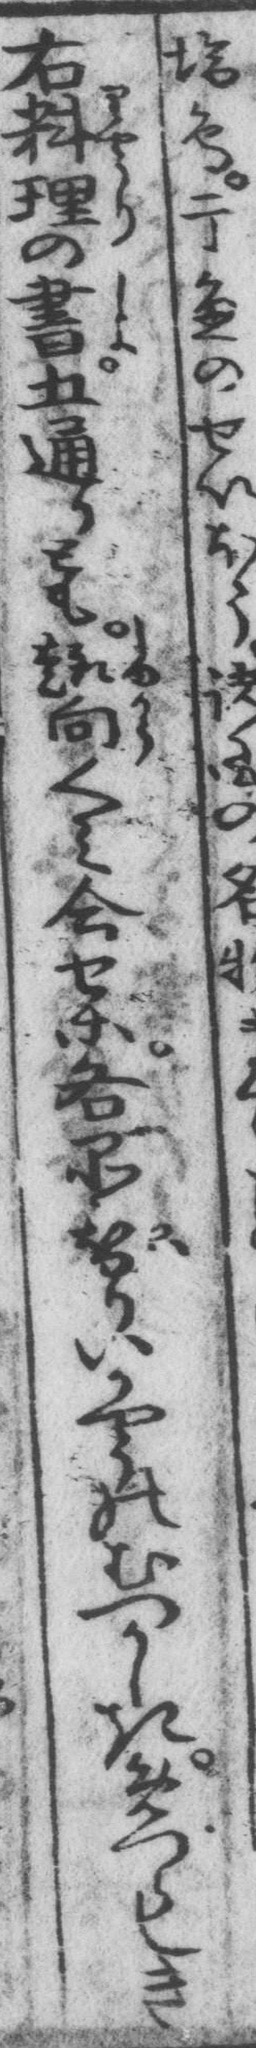右料理の書。五通りとも。趣向くみ合せ等。各品替りいかやうのむつかしき。めつらしき
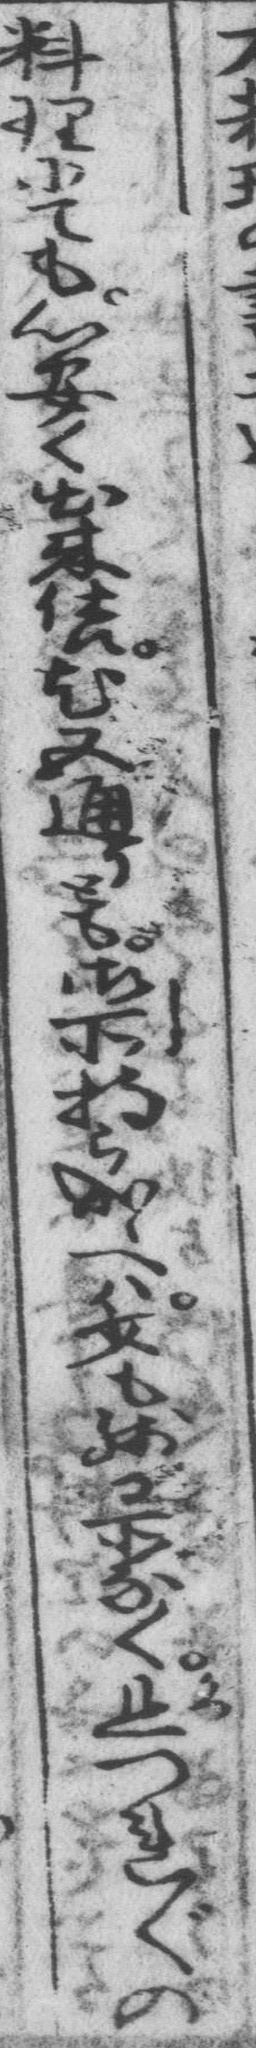料理にても。心安く出来仕候。尤五通りとも。御所持被成候へは。文も残る所なく。且つれ〴〵の
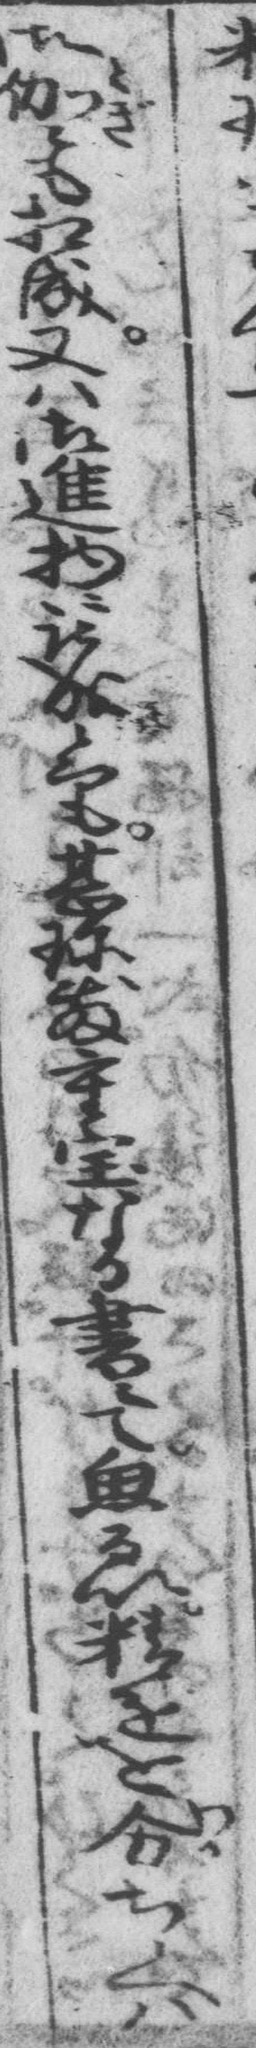御伽にも相成。又は御進物に被成候ても。甚珍敷重宝なる書にて。魚るい。精進を分ち候へは
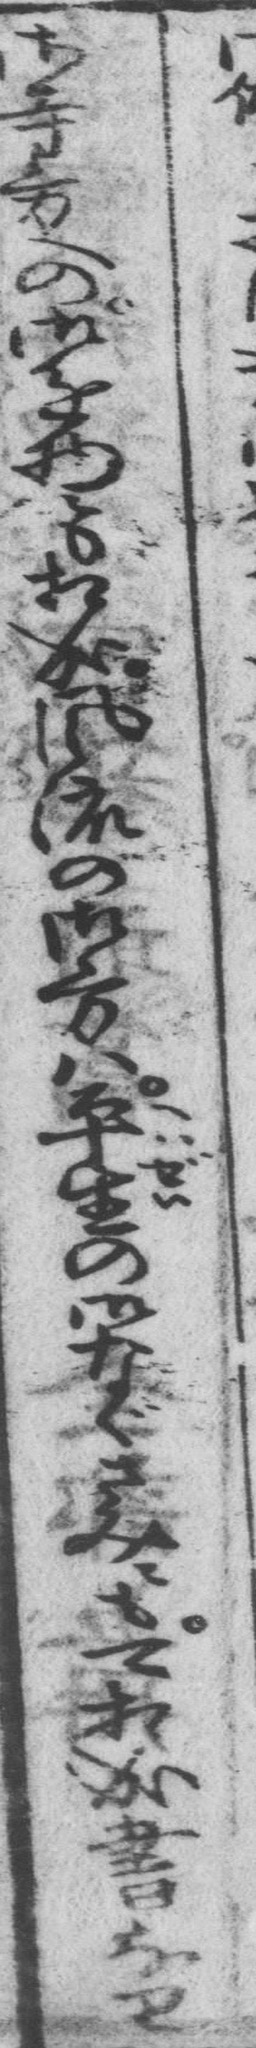御寺方への。御進物にも相成。風流の御方は。平生の御なぐさみにも。可相成書なり
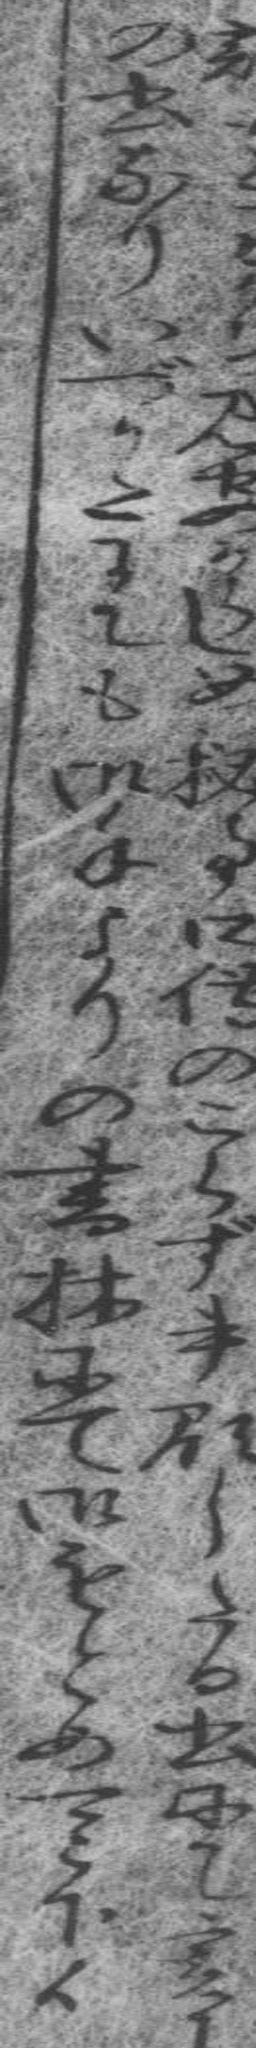の書なりいづかたにても御手よりの書林にて御もとめ可被下候

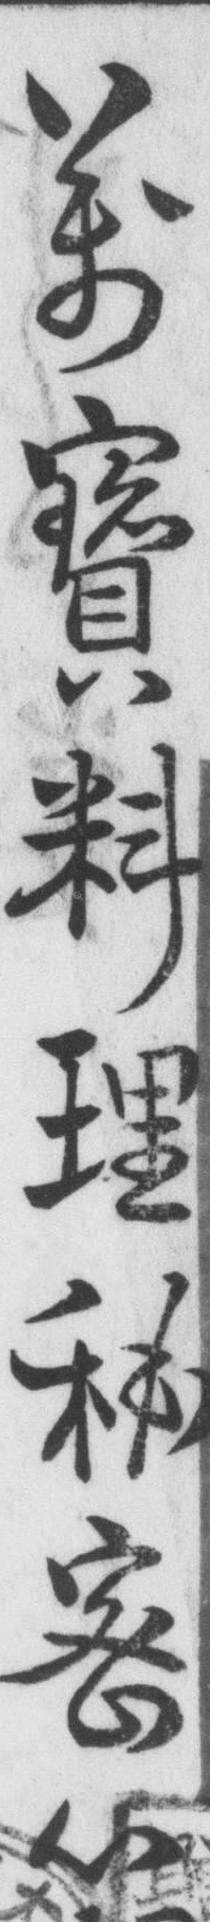万宝料理秘密箱
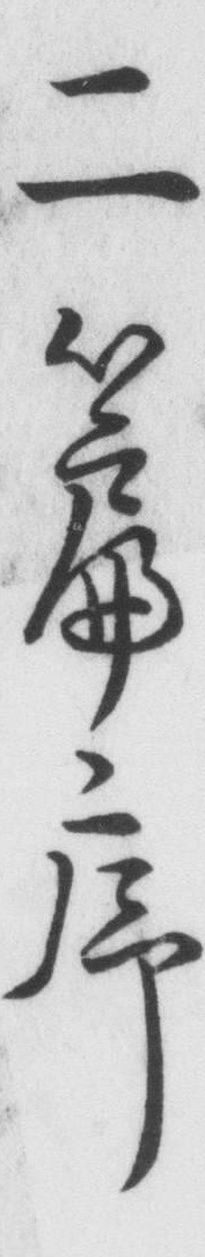二編序
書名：萬寳料理秘密箱
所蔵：大阪府立大学学術情報センター 国文学研究資料館
